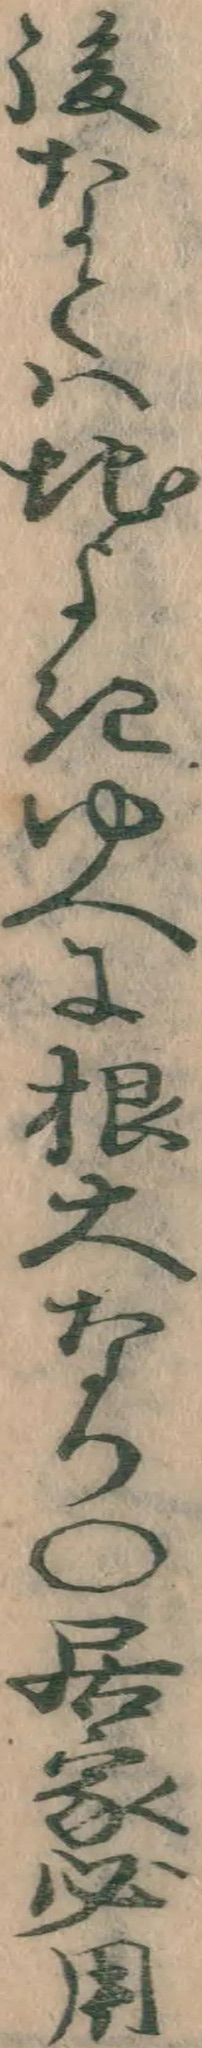後なとは地よきゆへに根大なり〇居家必用
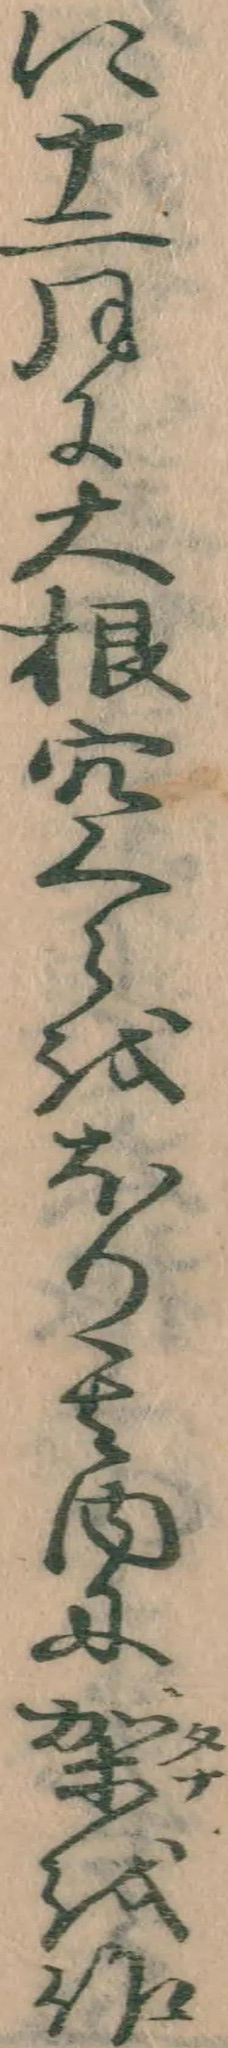に十二月に大根穴くらをほり其内に架を作
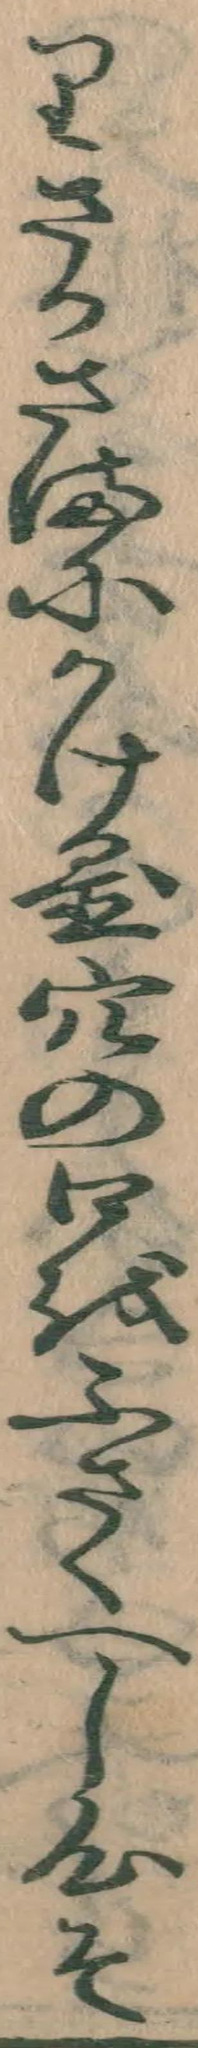りさかさまにかけ置穴の口をふさくへし心そ
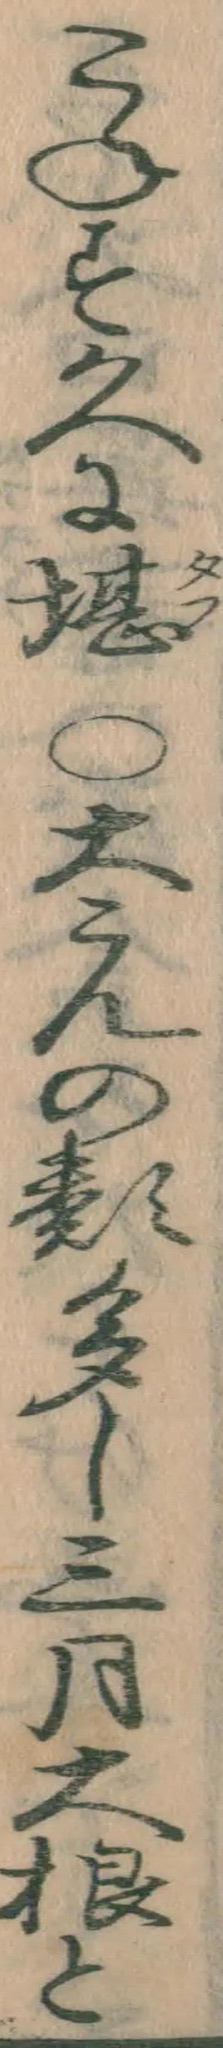こねす久に堪〇大こんの類多し三月大根と
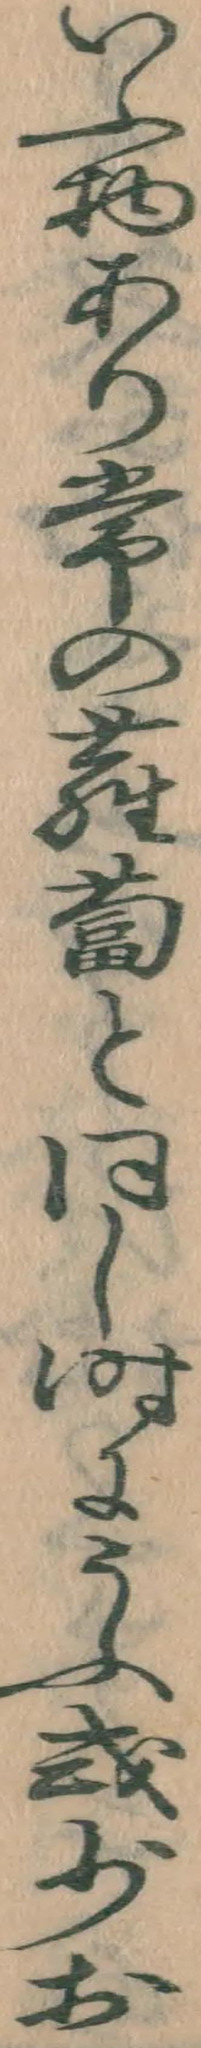いふ物あり常の蘿蔔と同し時にうふ或少お
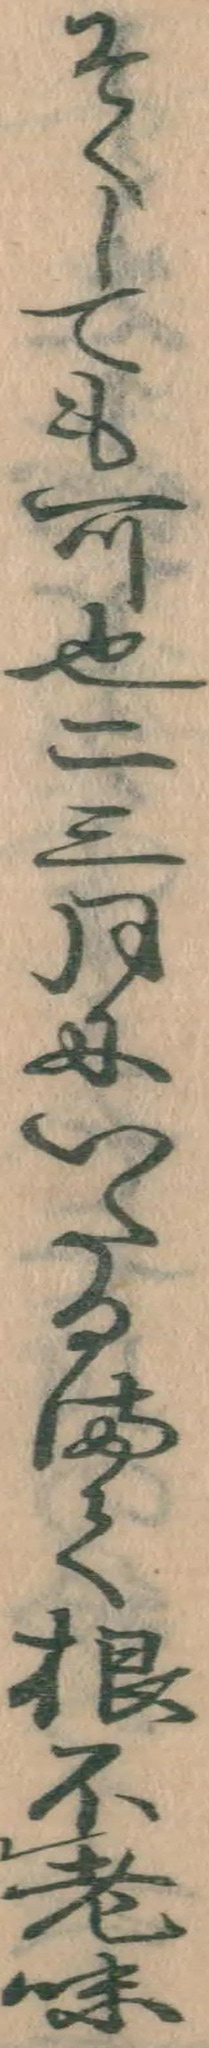そくしても可也二三月にいたるまて根不老味
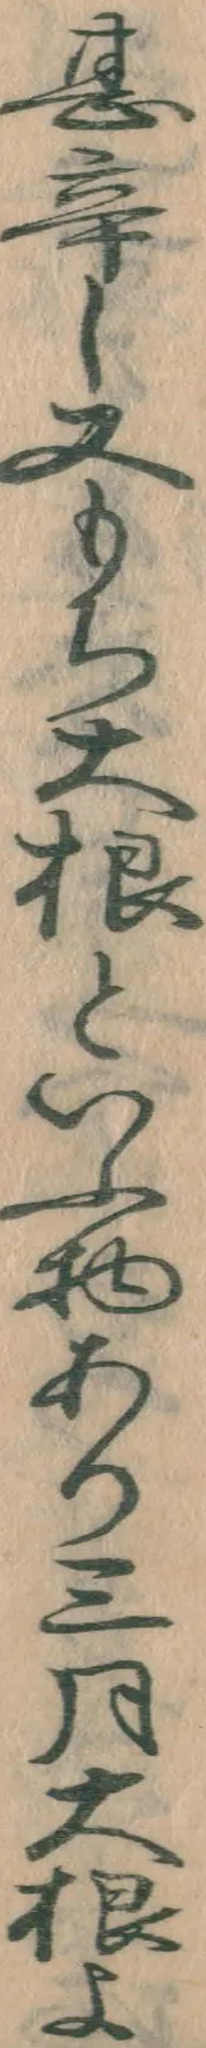甚辛し又もち大根といふ物あり三月大根よ
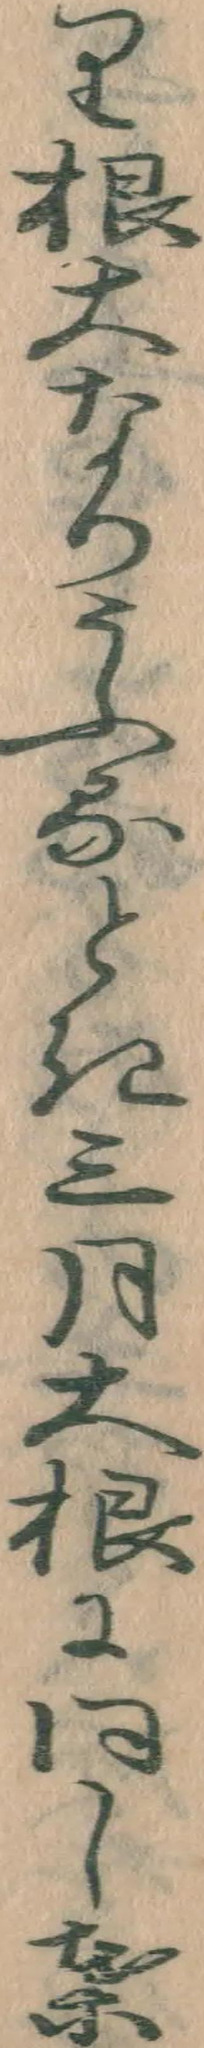り根大なりうふるとき三月大根に同し葉
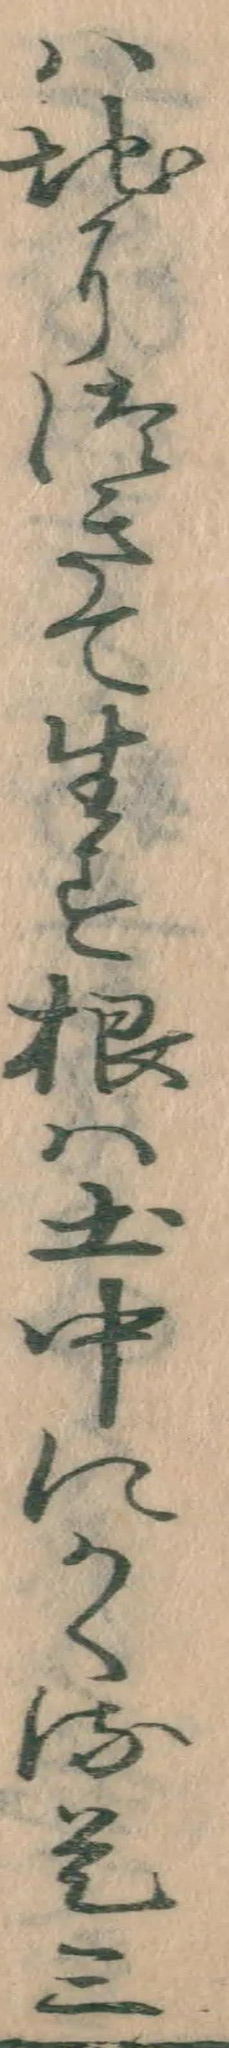は地につきて生す根は土中にかくる是三
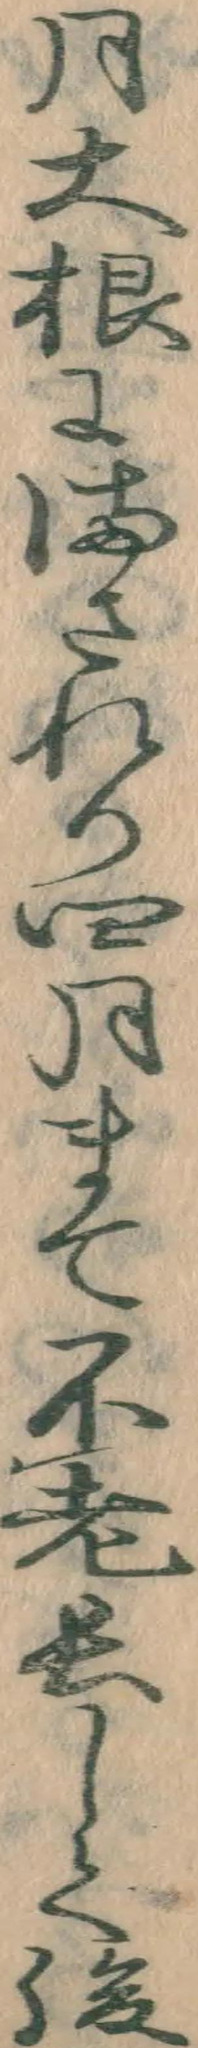月大根にまされり四月まて不老長して後
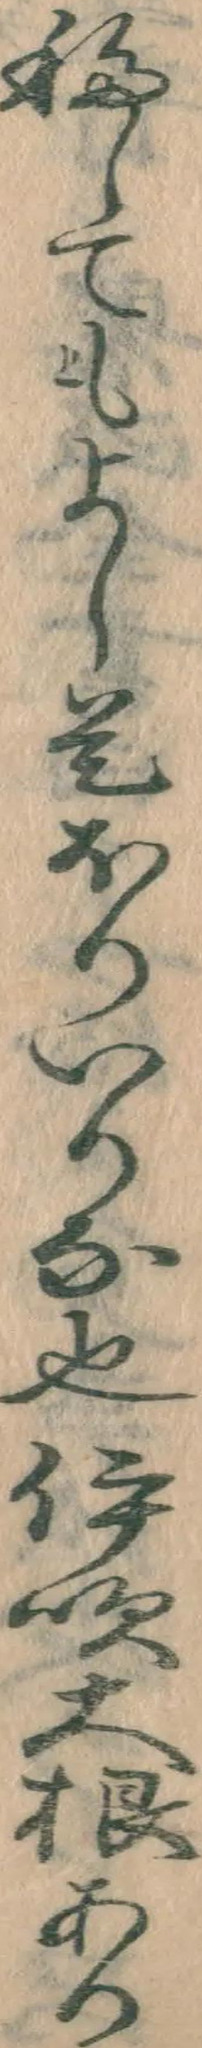移してもよし是ほりいりな也伊吹大根あり
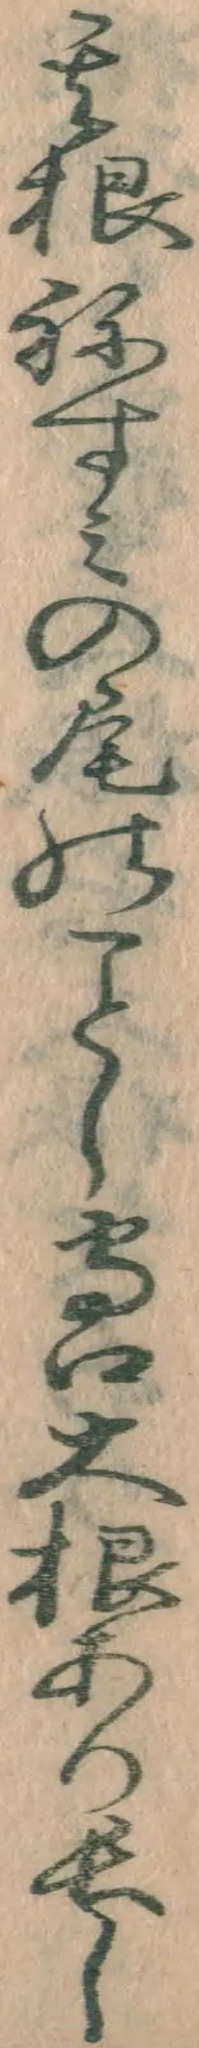其根ねすみの尾のことし守口大根あり長し
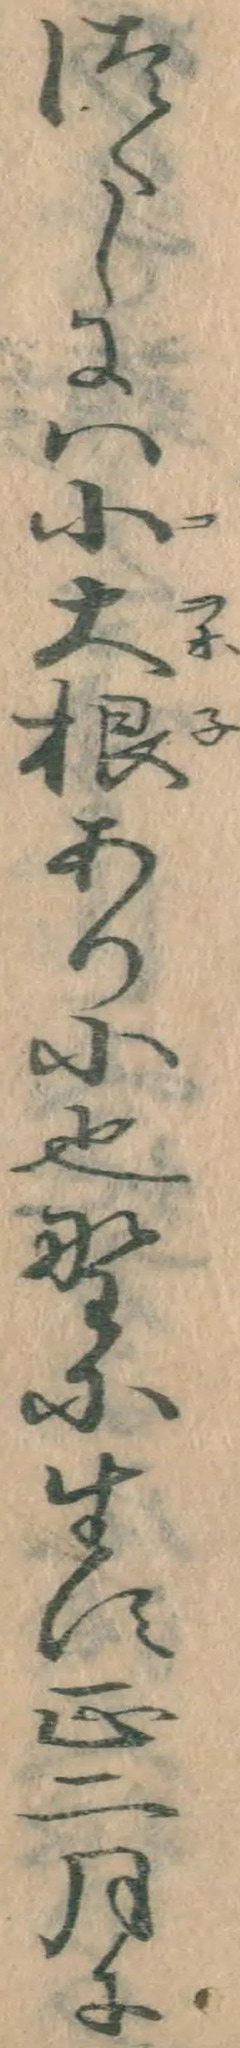つくしには小大根あり小也野に生す正二月に

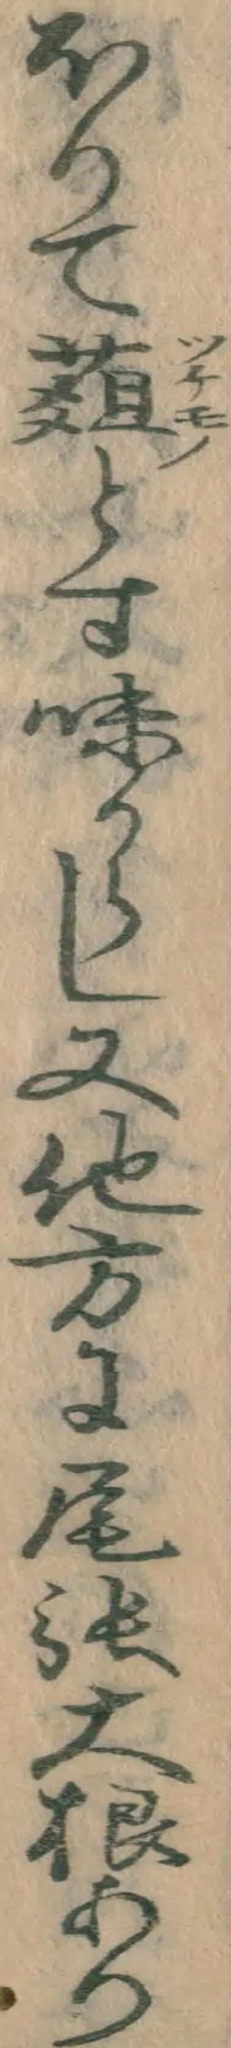ほりて葅とす味からし又他方に尾張大根あり
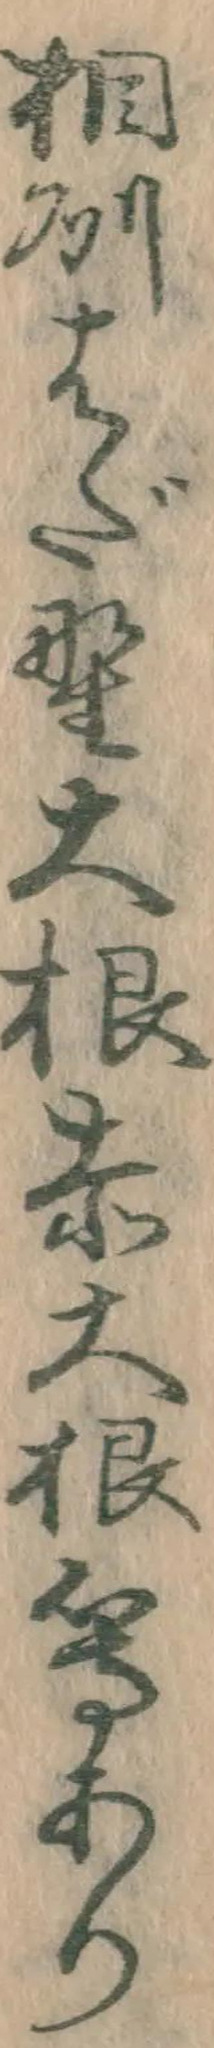相州はだ野大根赤大根等あり
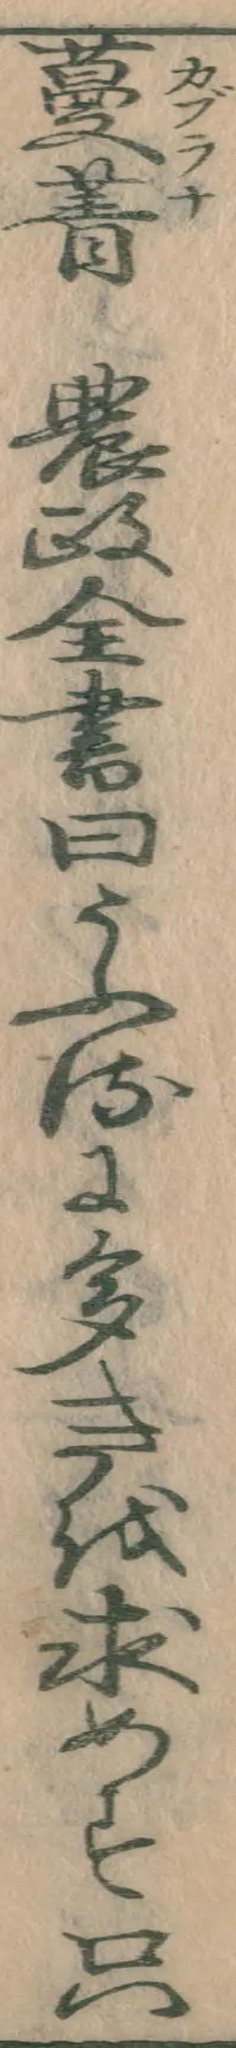蔓菁農政全書曰うふるに多きを求めず只
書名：菜譜 3巻
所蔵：国立国会図書館 National Diet Library, JAPAN
